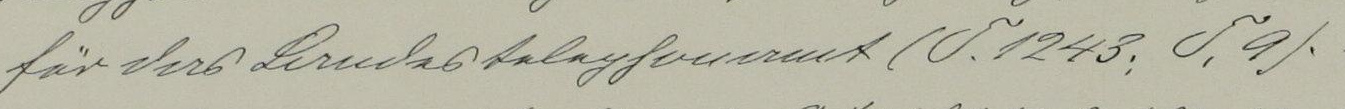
für das Landestelephonamt (T.1243; T.9).
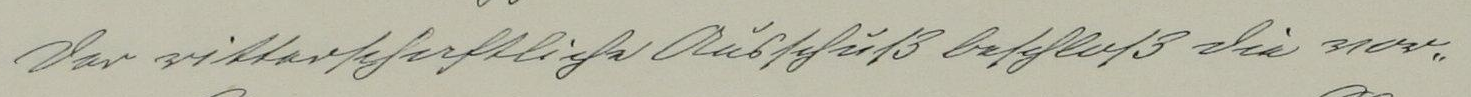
Der ritterschaftliche Ausschuß beschloß die vor-
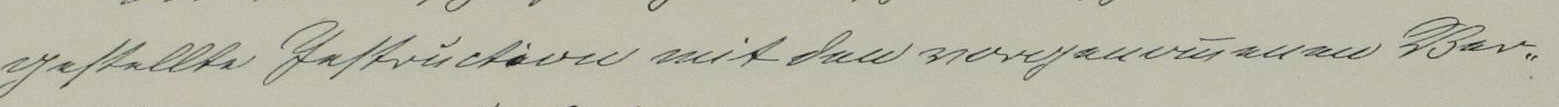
gestellte Instruction mit den vorgenommenen Ver-
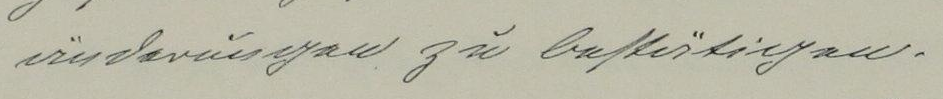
änderungen zu bestätigen.
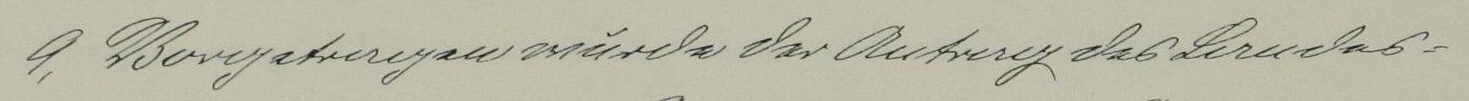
9. Vorgetragen wurde der Antrag des Landes-
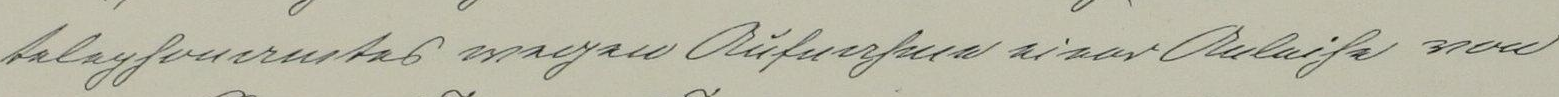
telephonamtes wegen Aufnahme einer Anleihe von
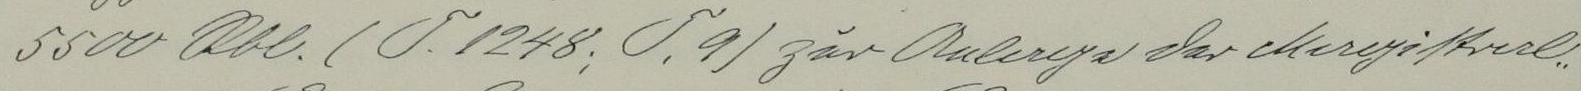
5500 Rbl. (T.1248; T.9) zur Anlage der Magistral-
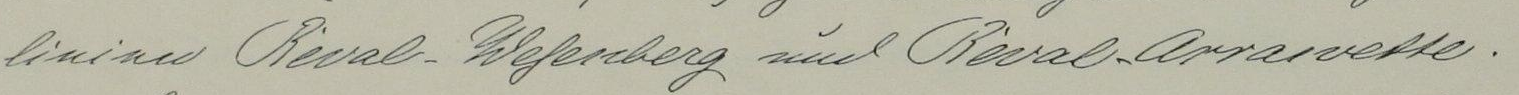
linien Reval-Wesenberg und Reval-Arrawette.
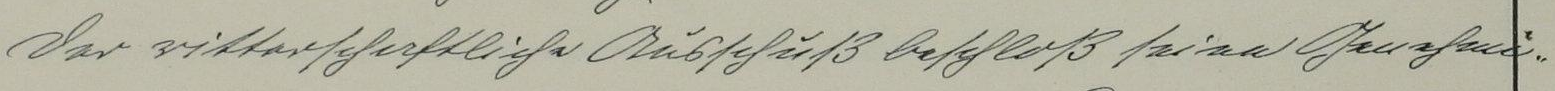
Der ritterschaftliche Ausschuß beschloß seine Genehmi-
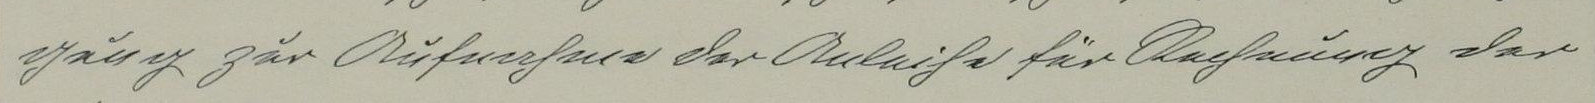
gung zur Aufnahme der Anleihe für Rechnung der
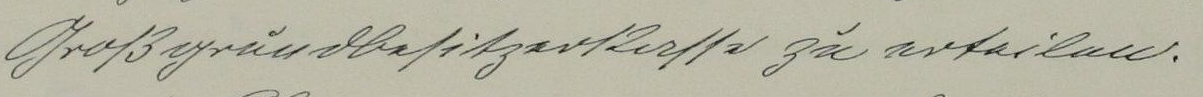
Großgrundbesitzerkasse zu erteilen.
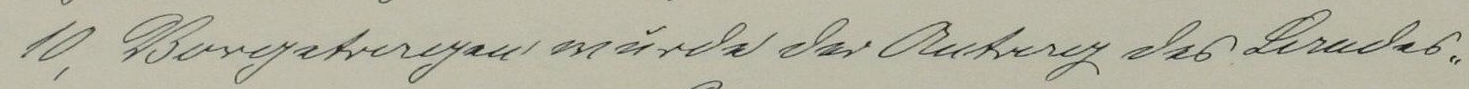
10. Vorgetragen wurde der Antrag des Landes-
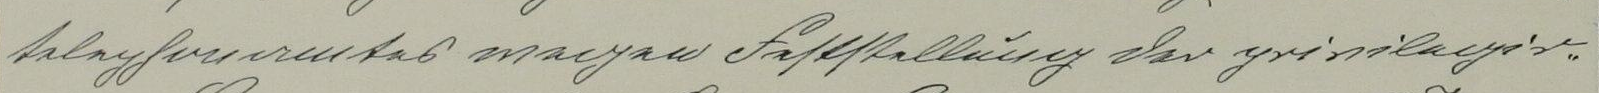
telephonamtes wegen Feststellung der privilegir-
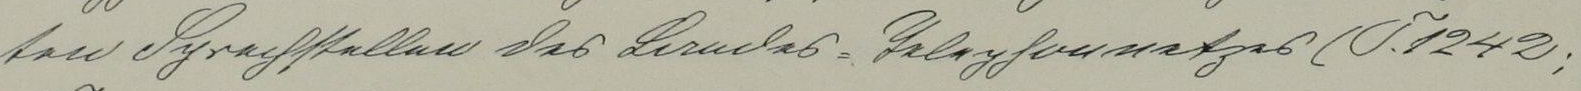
ten Sprechstellen des Landes-Telephonnetzes (T.1242;
